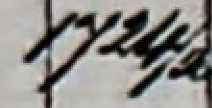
1724/a
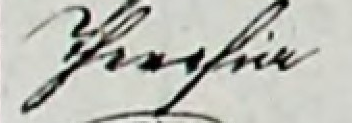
Theresia
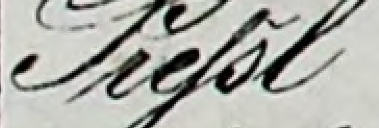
Pressl
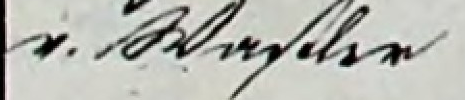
v. Wastler
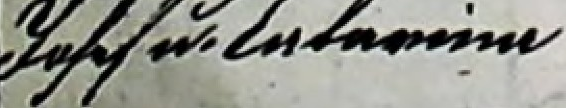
Josef u. Catarina
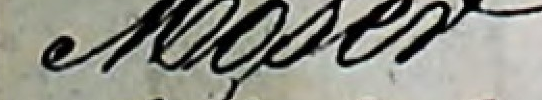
Moser
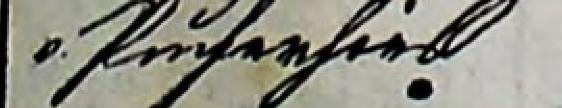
v. Pucherhiess
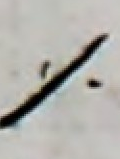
./.
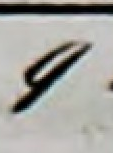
9
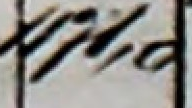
471,0
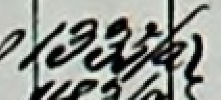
1335/a
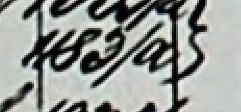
1183/a
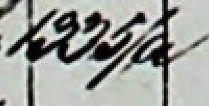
1335/a
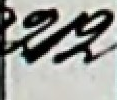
212
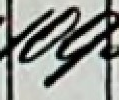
109
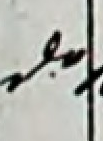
do
